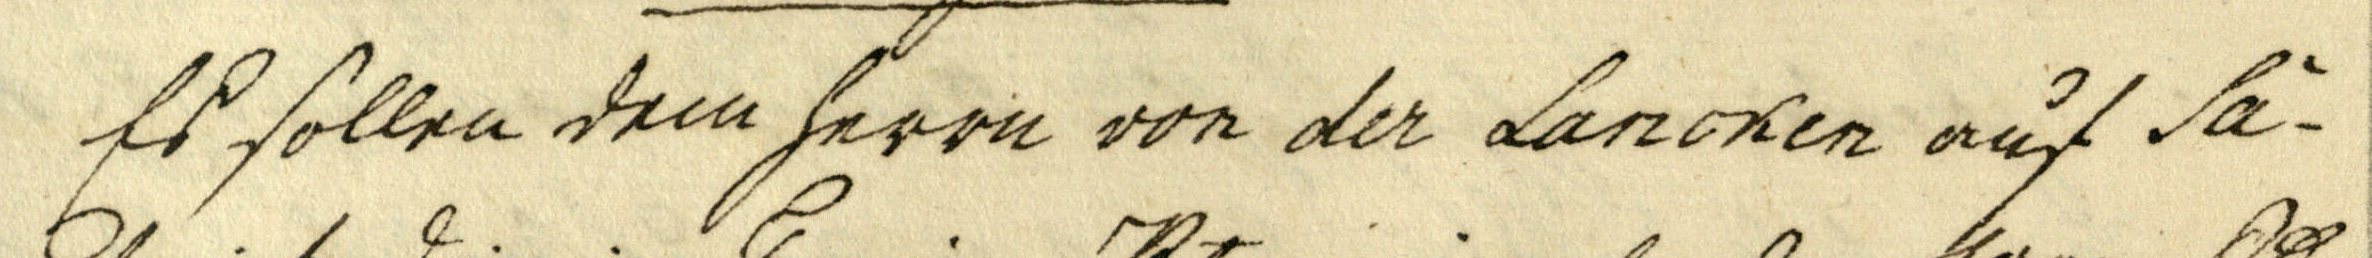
Es sollen dem Herrn von der Lancken auf Sa¬
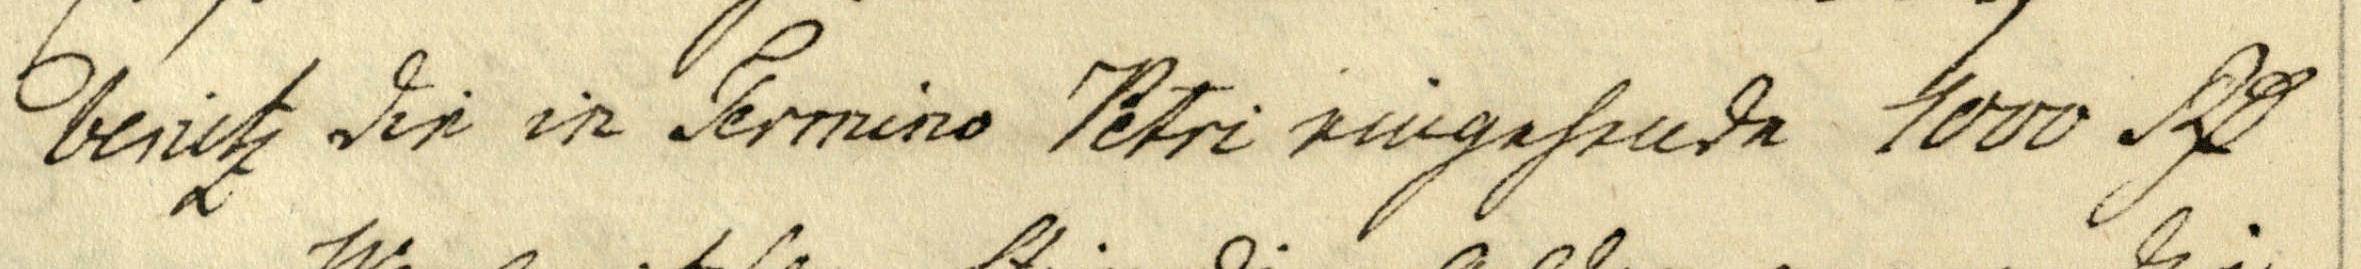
benitz die in Termino Petri eingehende 1000 Rt.
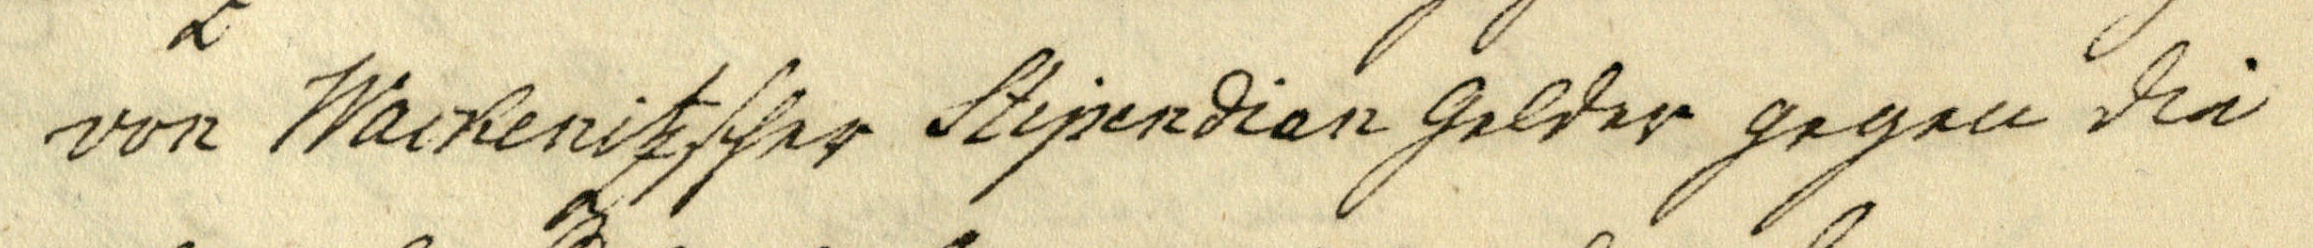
von Wackenitzscher Stipendien Gelder gegen die
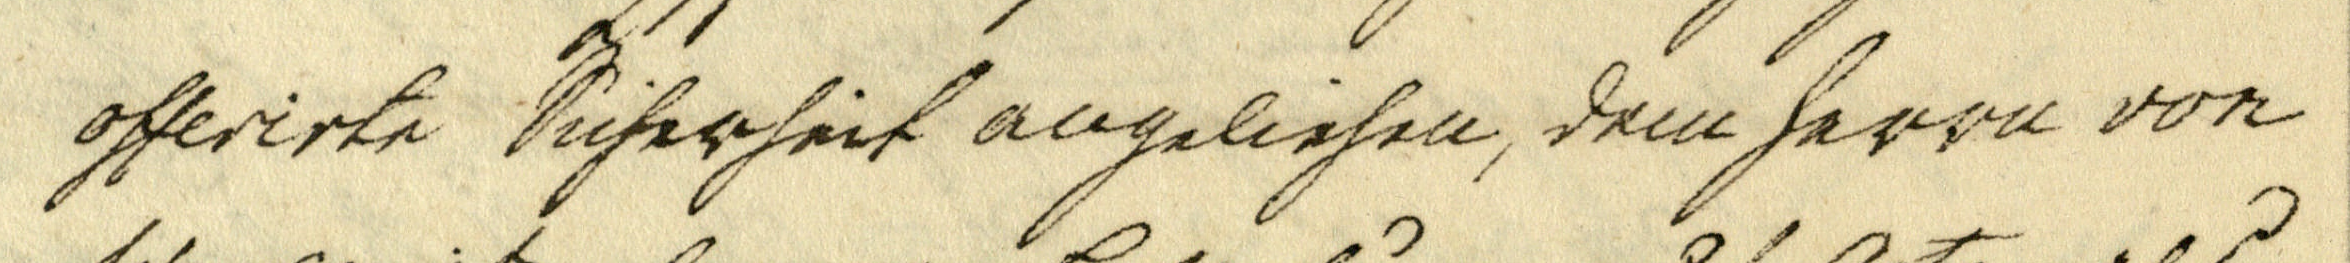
offerirte Sicherheit angeliehen, dem Herrn von
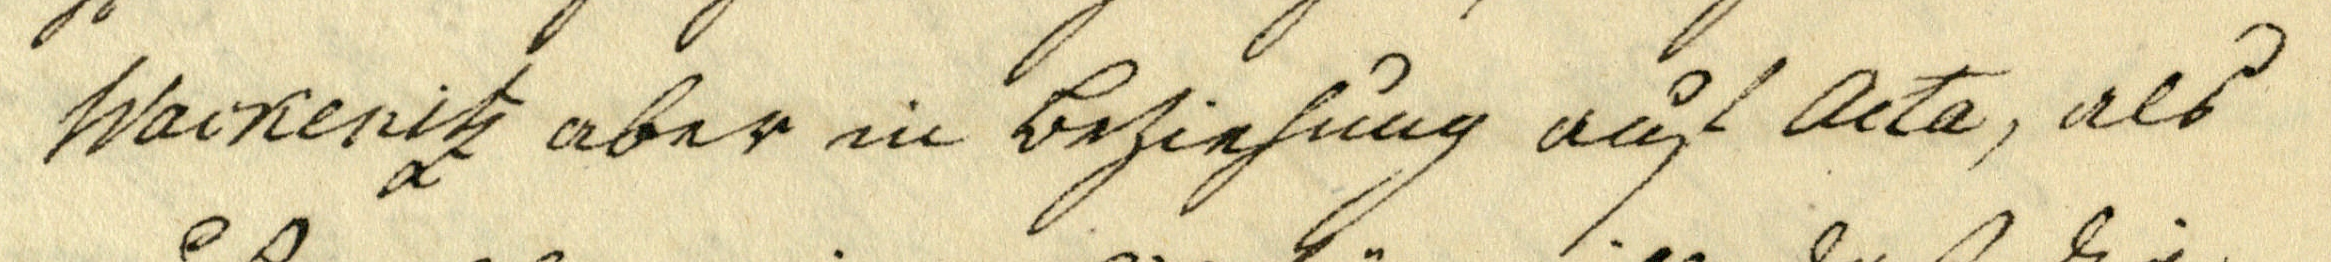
Wackenitz aber in Beziehung auf Acta, als
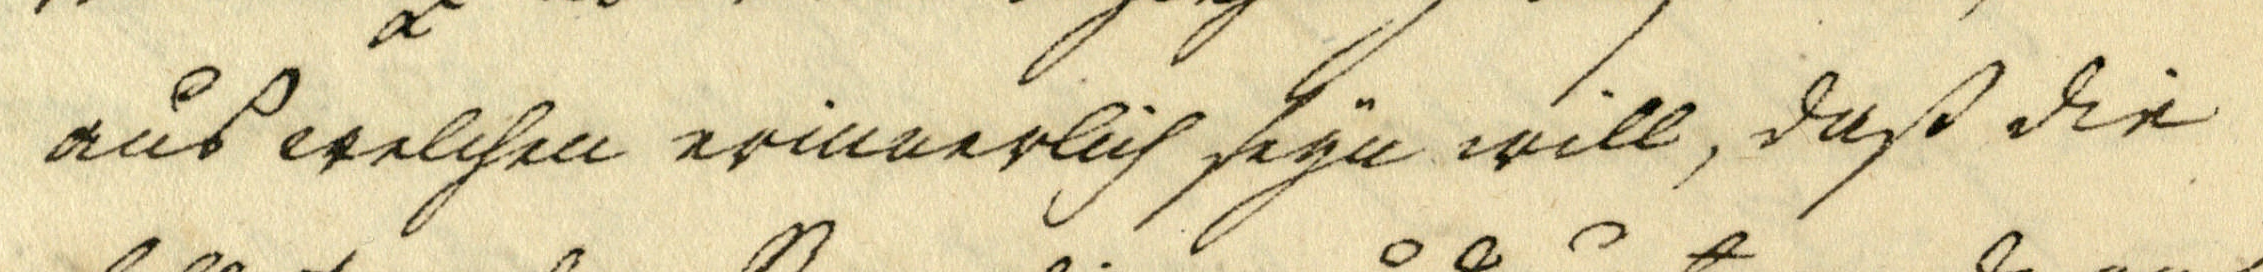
aus welchen erinnerlich seÿn will, daß die
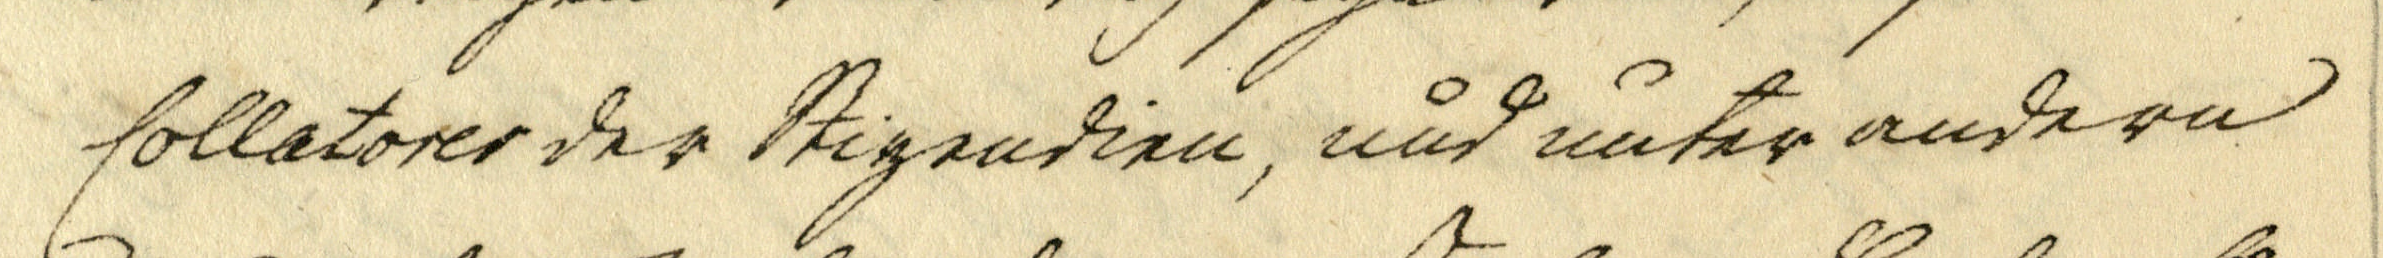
Collatores der Stipendien, und unter andern
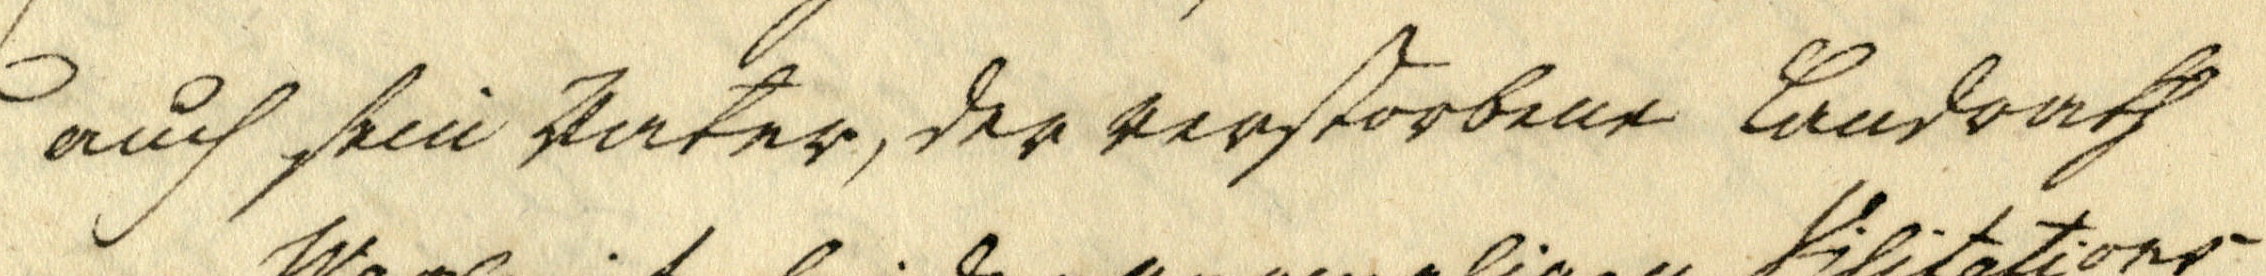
auch sein Vater, der verstorbene Landrath
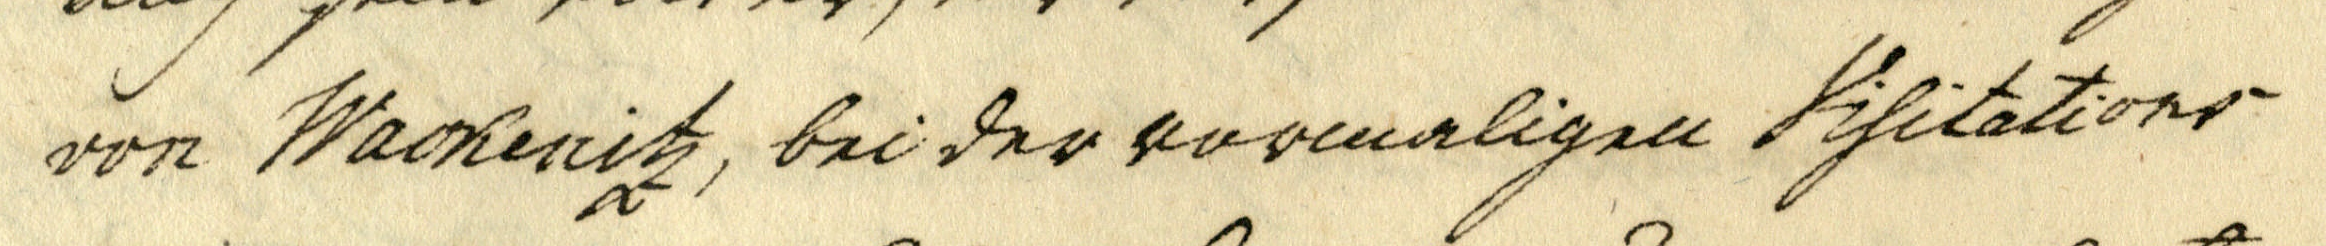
von Wackenitz, bei der vormaligen Visitations
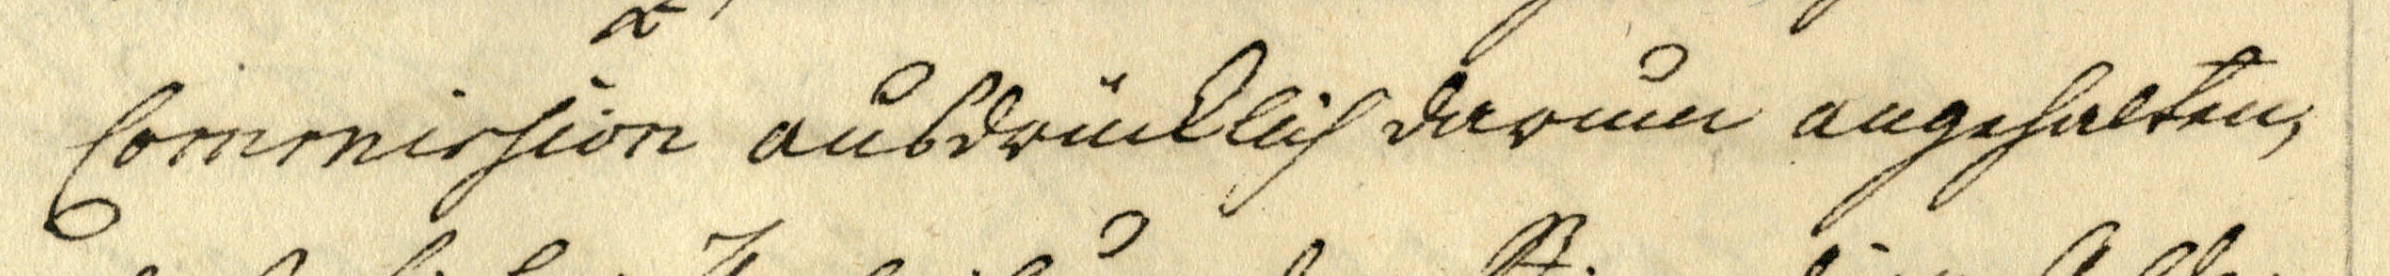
Commission ausdrücklich darum angehalten,
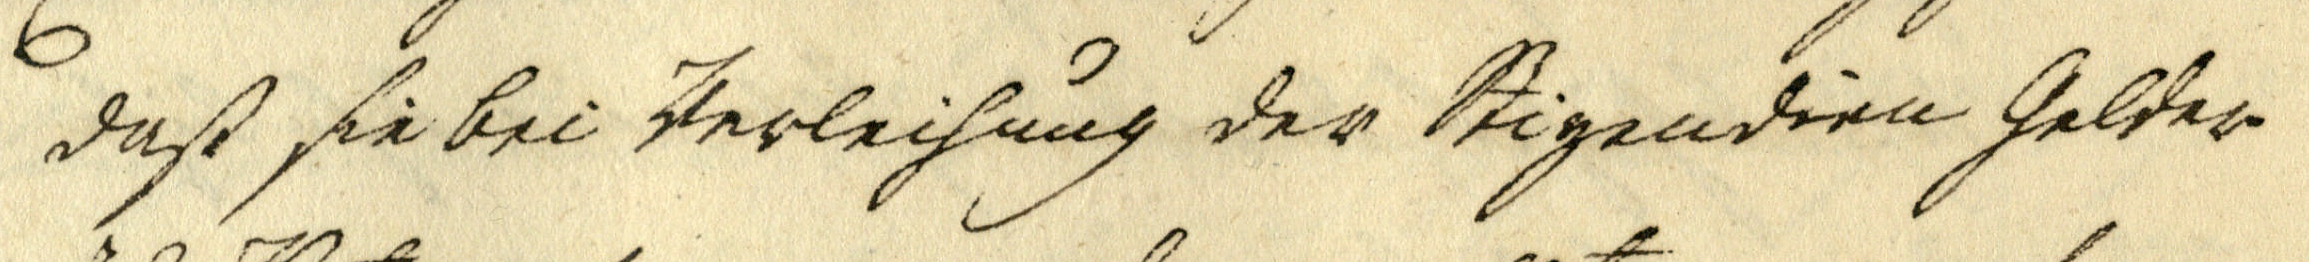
daß sie bei Verleihung der Stipendien Gelder
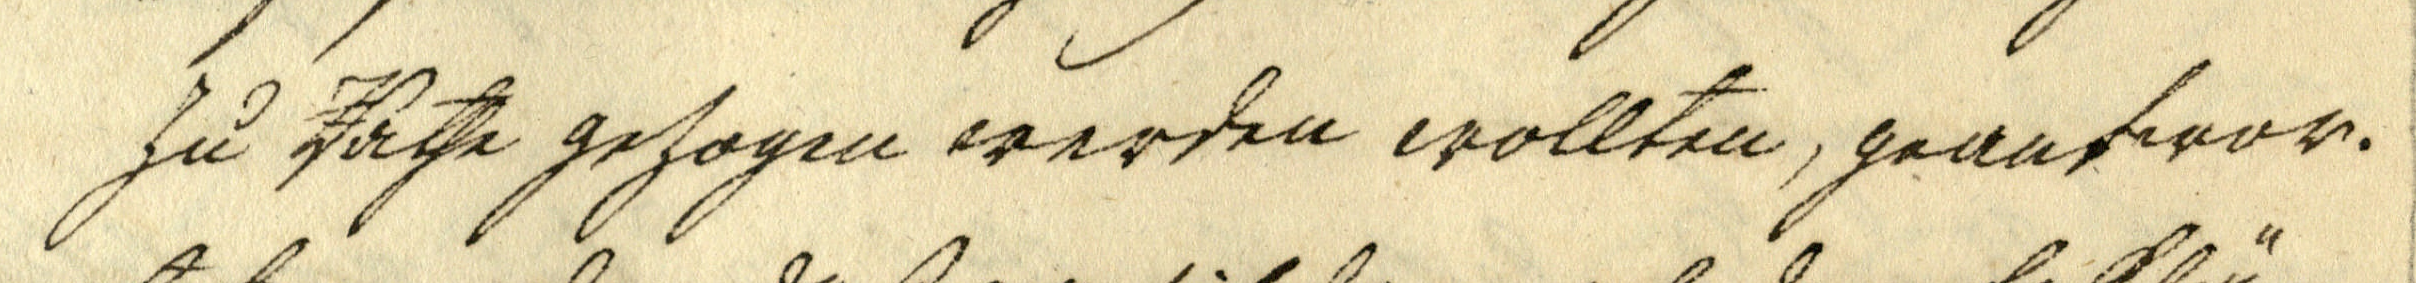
zu Rathe gezogen werden wollten, geantwor¬
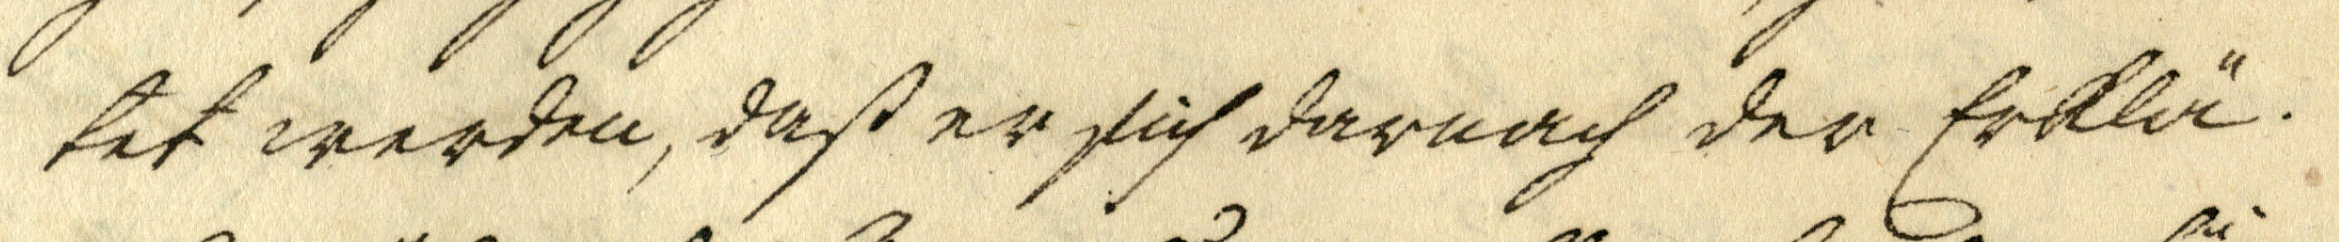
tet werden, daß er sich darnach der Erklä¬
